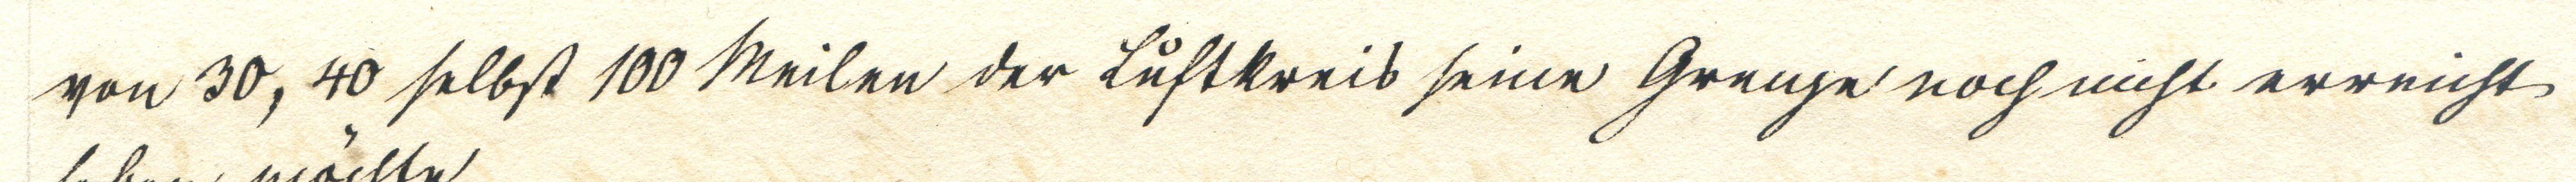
von 30, 40 selbst 100 Meilen der Luftkreis seine Grenze noch nicht erreicht
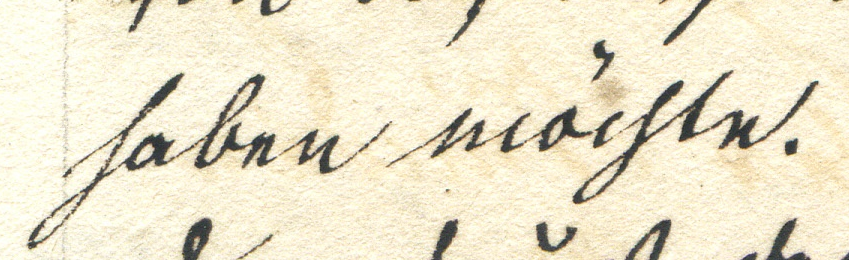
haben möchte.
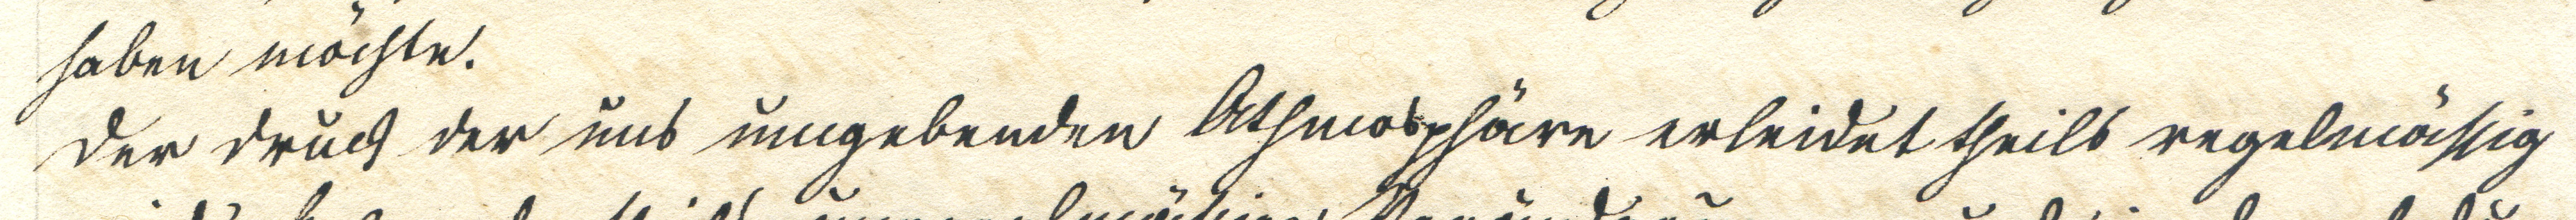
Der Druck der uns umgebenden Athmosphäre erleidet theils regelmässig
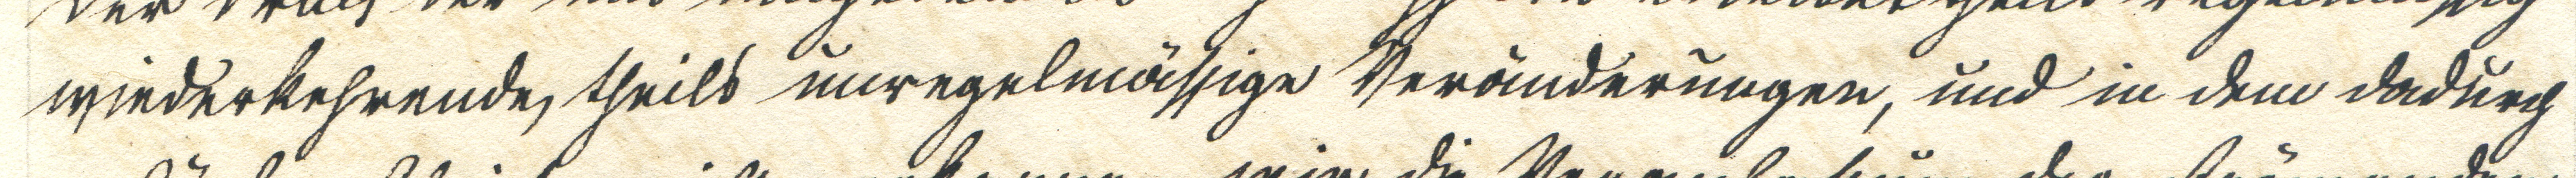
wiederkehrende, theils unregelmässige Veränderungen, und in dem dadurch
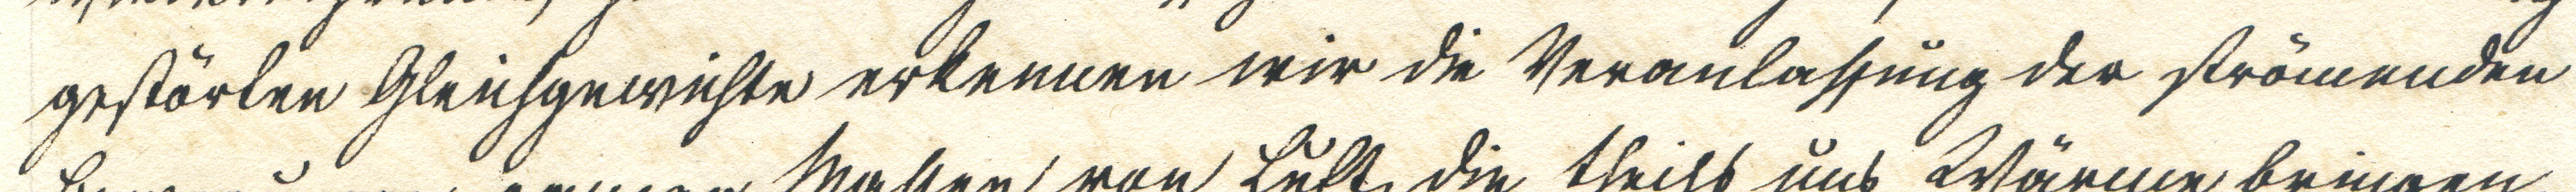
gestörten Gleichgewichte erkennen wir die Veranlassung der strömenden
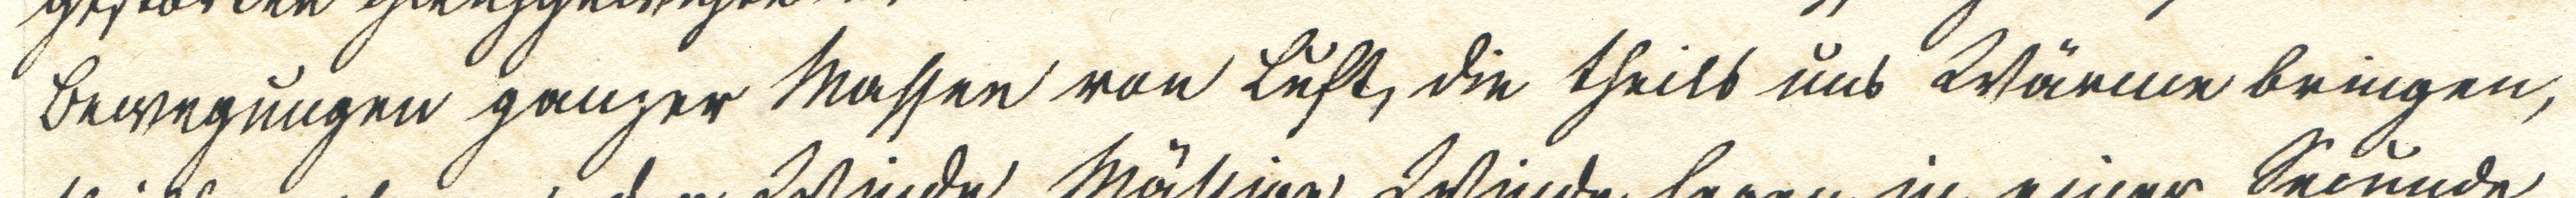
Bewegungen ganzer Massen von Luft, die theils uns Wärme bringen,
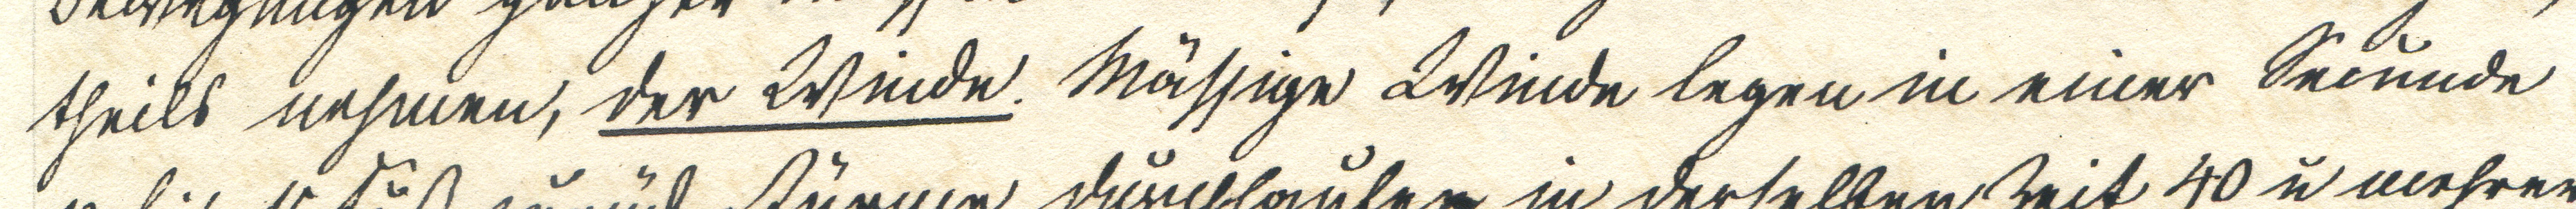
theils nehmen, der Winde. Mässige Winde legen in einer Secunde
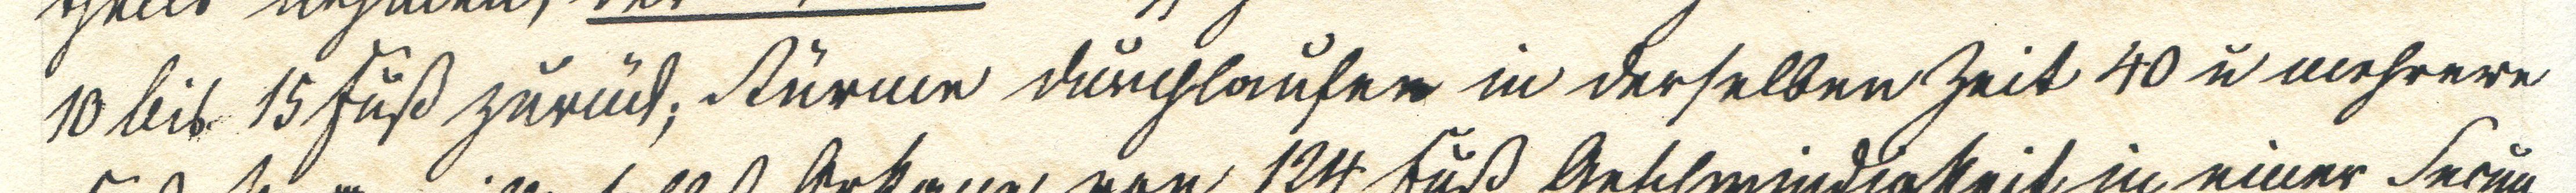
10 bis 15 Fuß zurück; Stürme durchlaufen in derselben Zeit 40 u mehrere
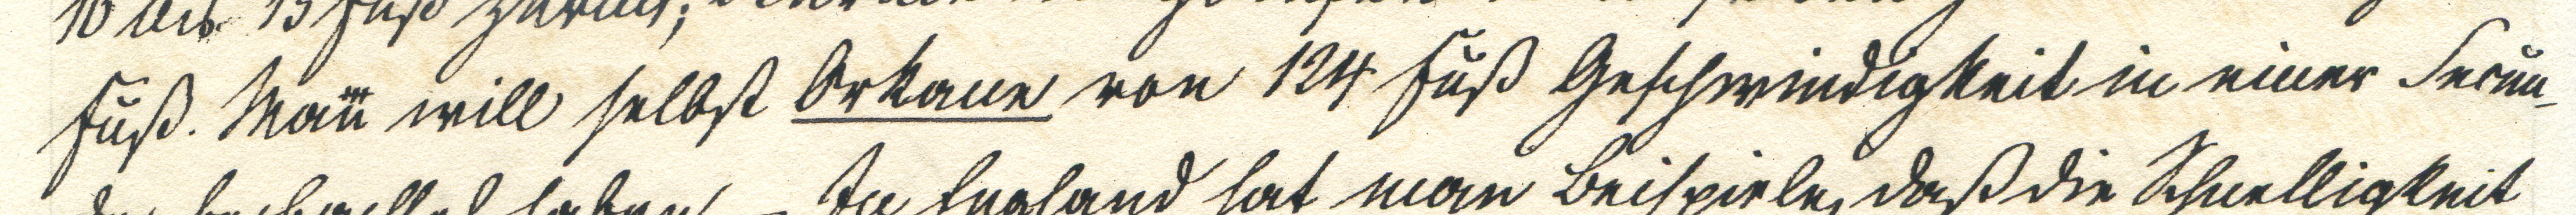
Fuß. Mañ will selbst Orkane mit 124 Fuß Geschwindigkeit in einer Secun-
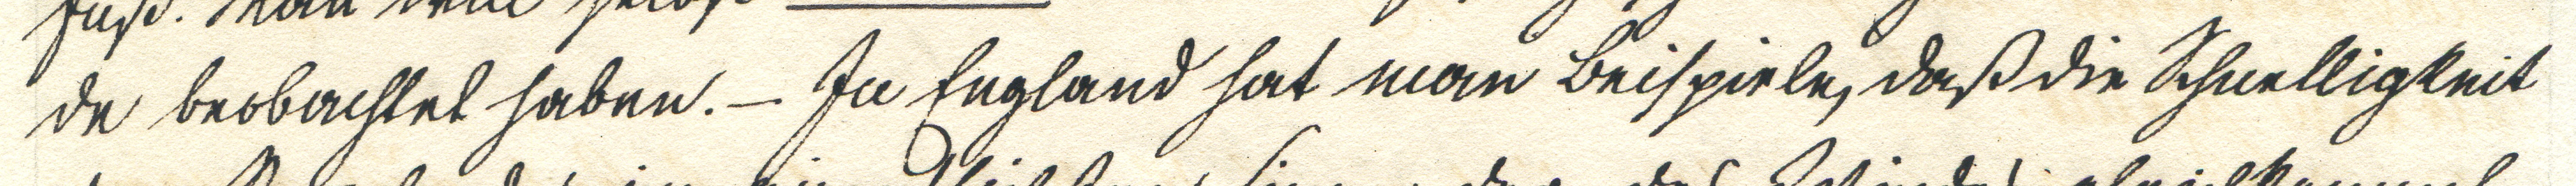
de beobachtet haben. – In England hat man Beispiele, daß die Schnelligkeit
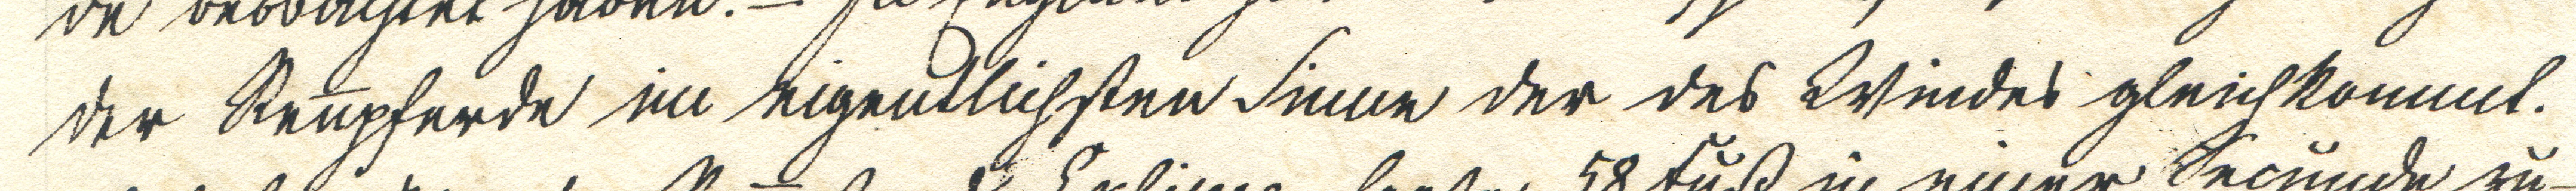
der Reñpferde im eigentlichsten Sinne der des Windes gleichkommt.
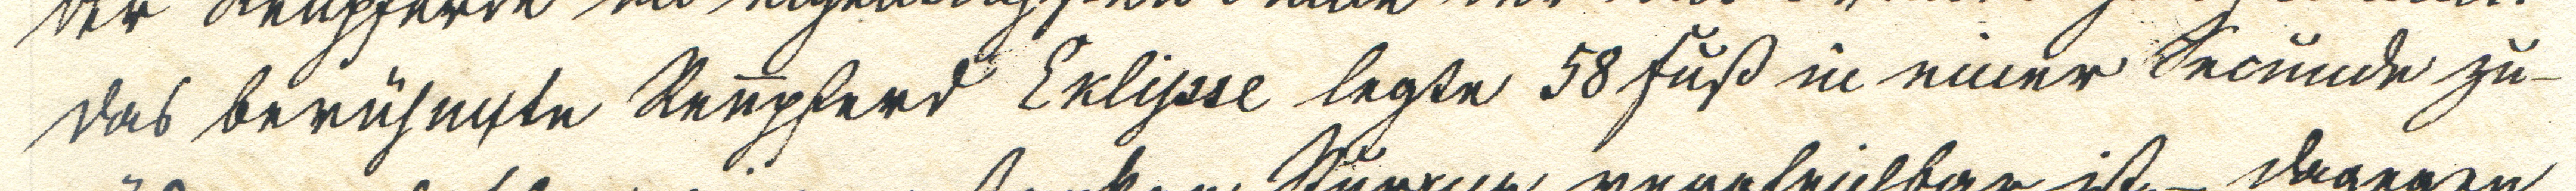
Das berühmte Reñpferd Eklipse legte 58 Fuß in einer Secunde zu-
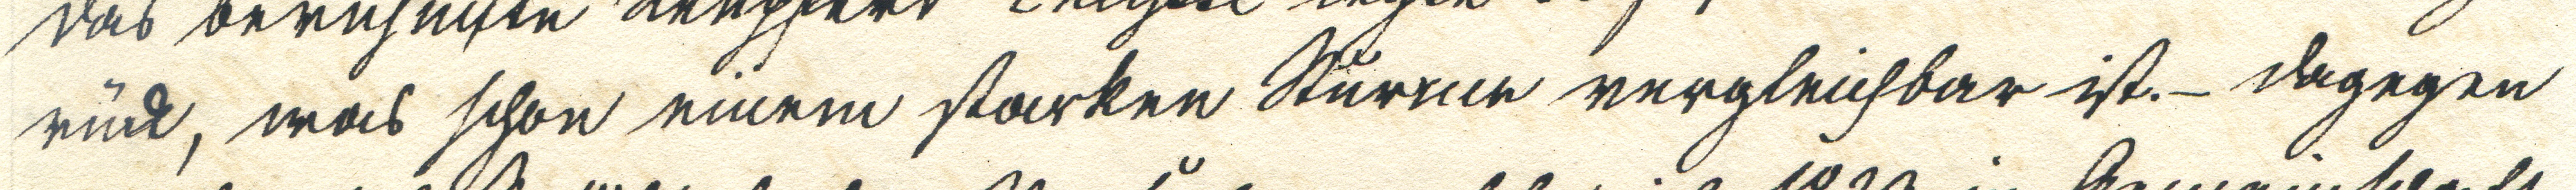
rück, was schon einem starken Sturme vergleichbar ist. – Dagegen
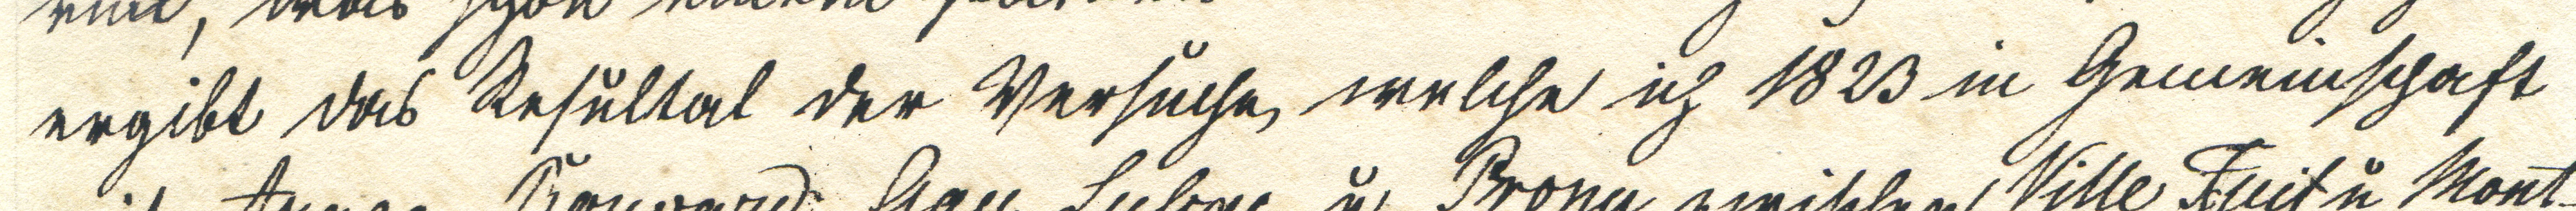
ergibt das Resultat der Versuche, welche ich im 1823 in Gemeinschaft
